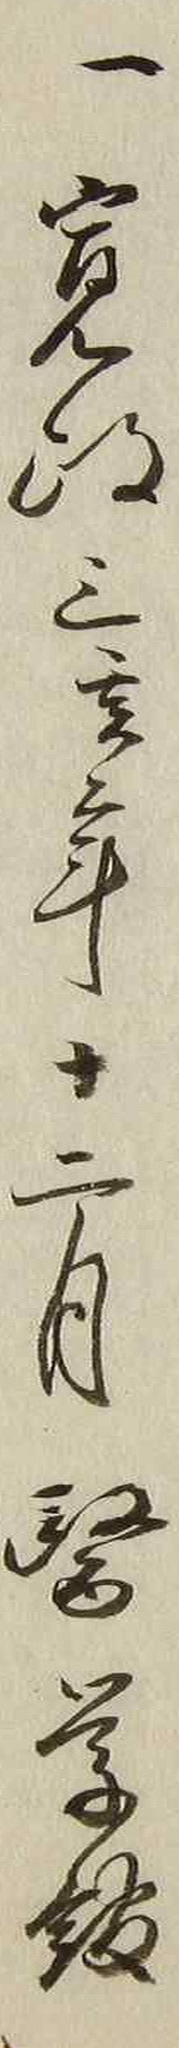一寛政三亥年十二月医学館
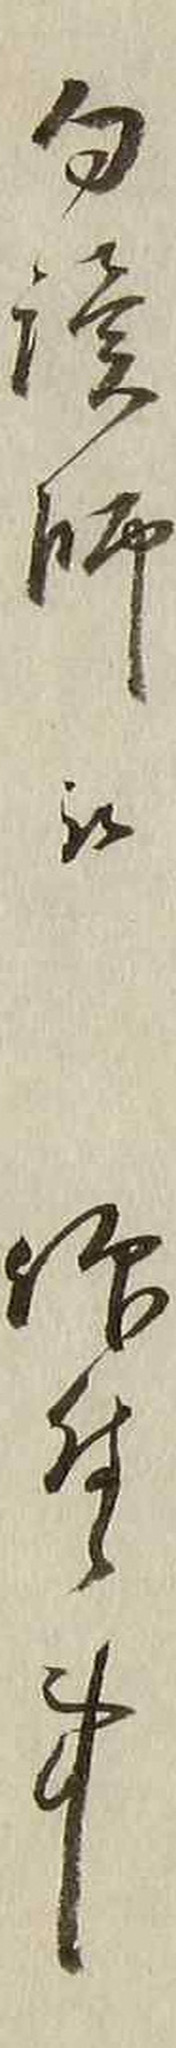句読師被仰付候事
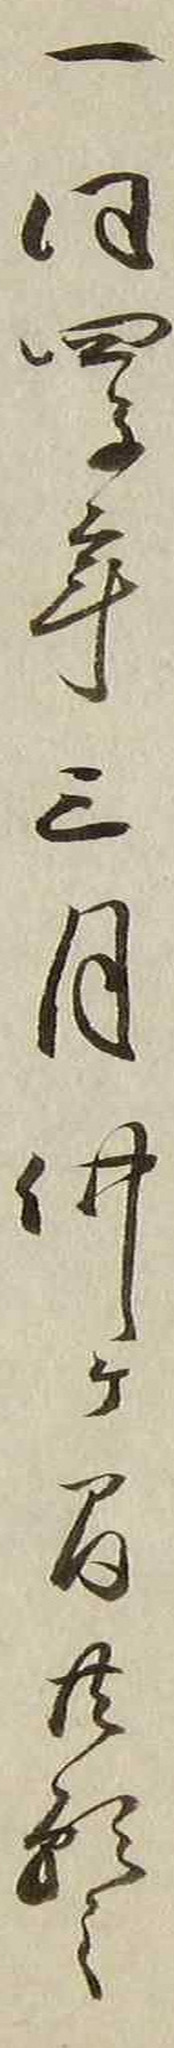一同四子年三月仲ヶ間共願之
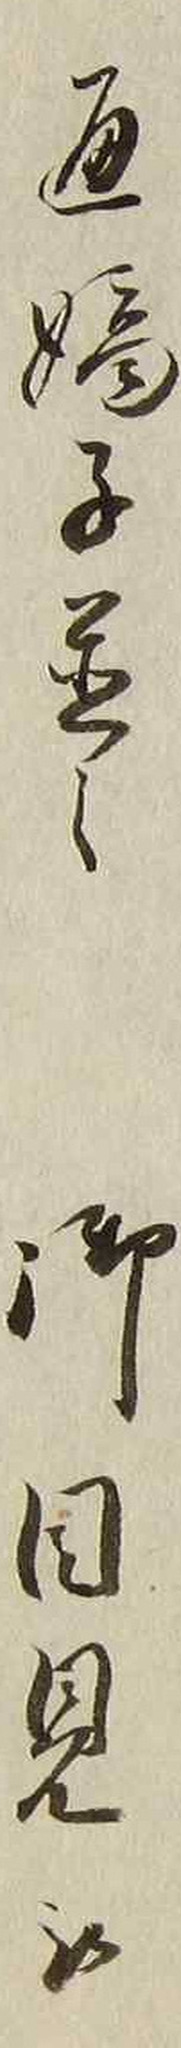通嫡子並之御目見被
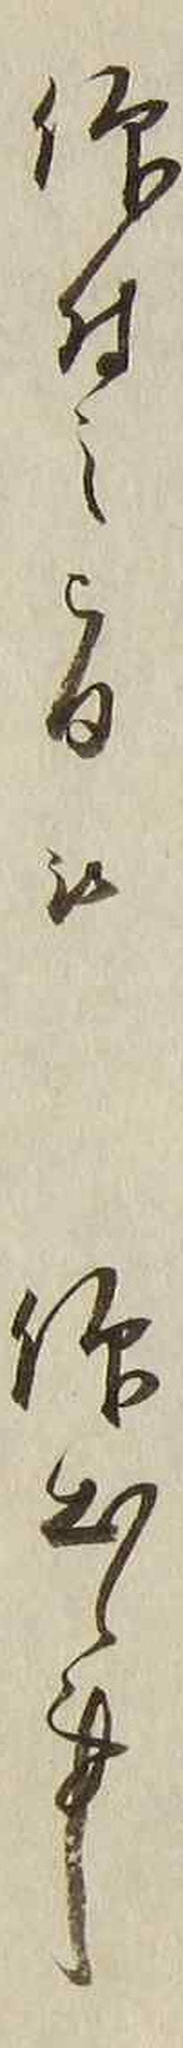仰付之旨被仰出候事
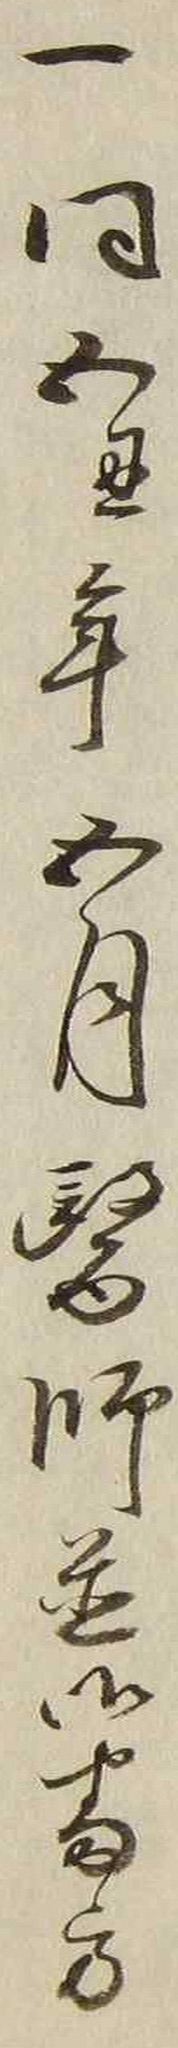一同五丑年五月医師並御番方

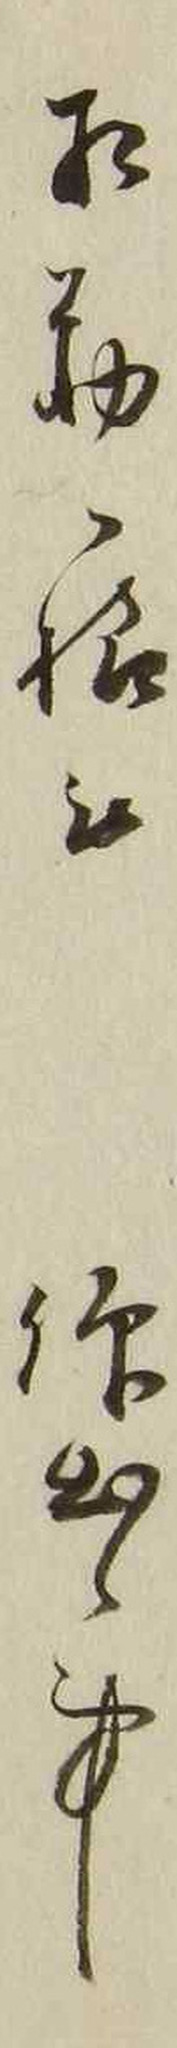相勤候様被仰出候事
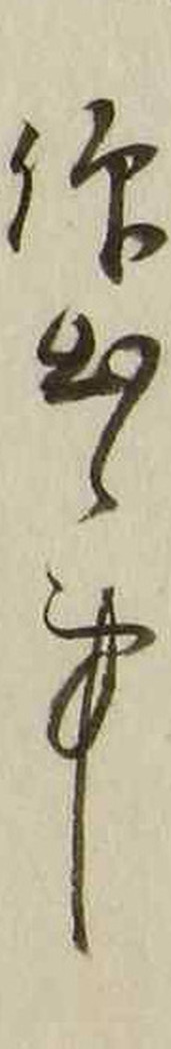罷出候事
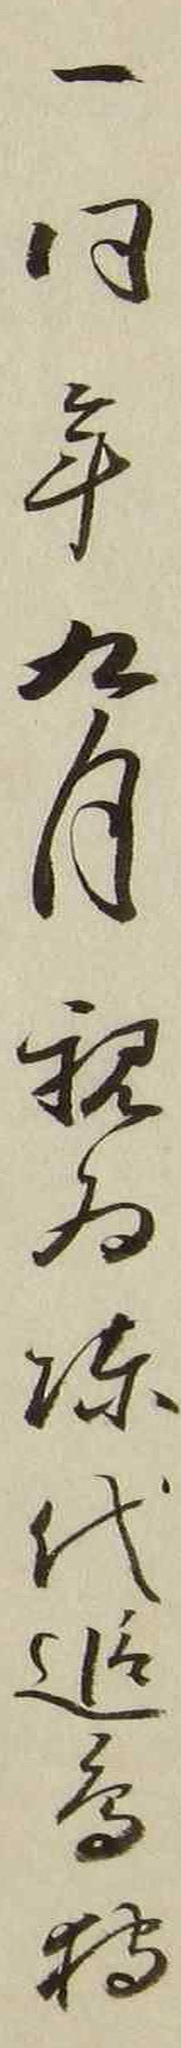一同年九月親為陣代追鳥狩
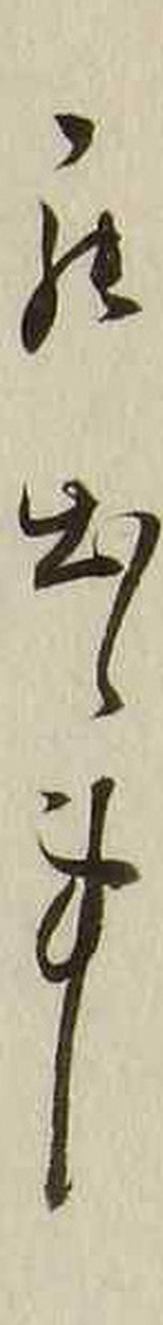罷出候事
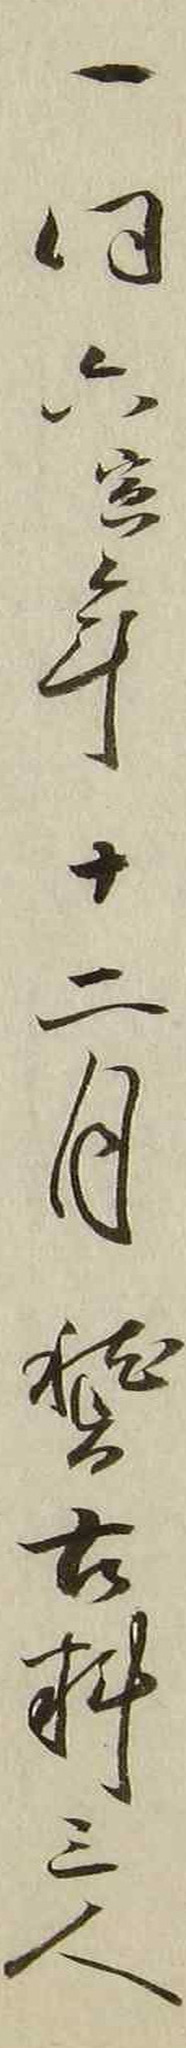一同六寅年十二月稽古料三人
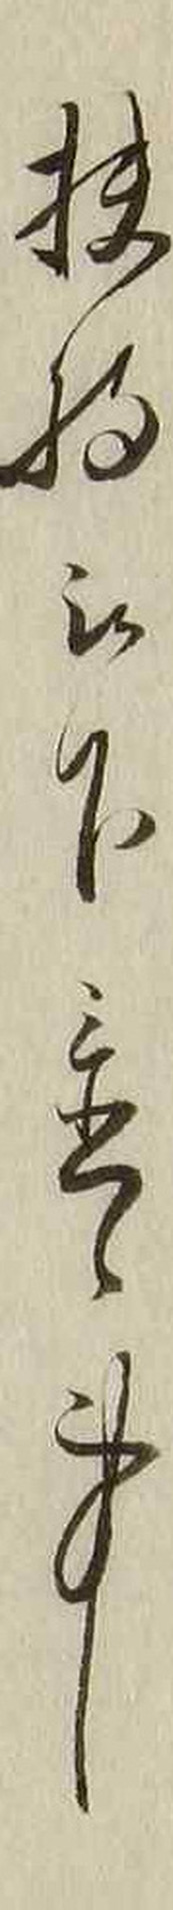扶持被下置候事
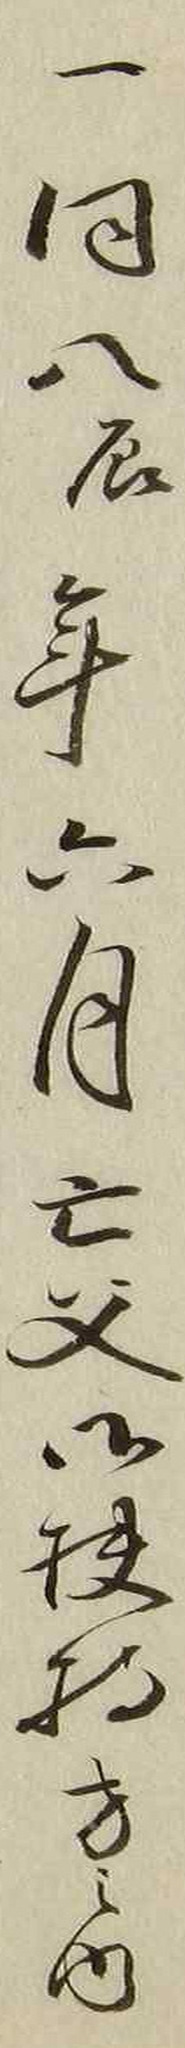一同八辰年六月亡父御扶持方之内
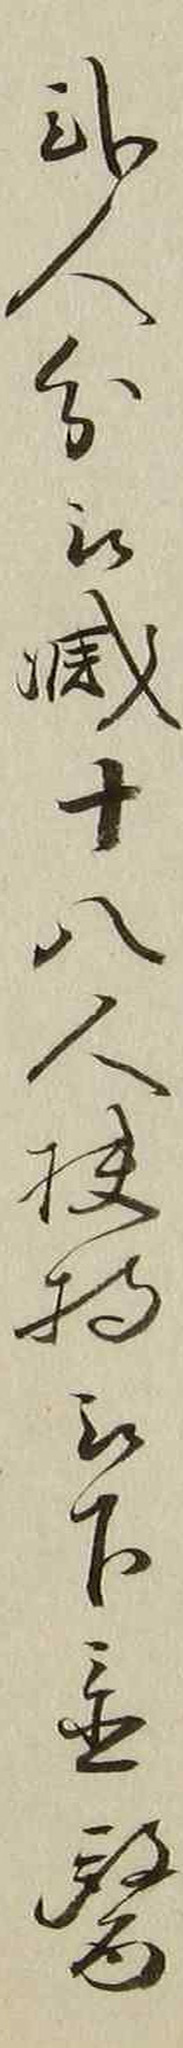弐人分被滅十八人扶持被下置医
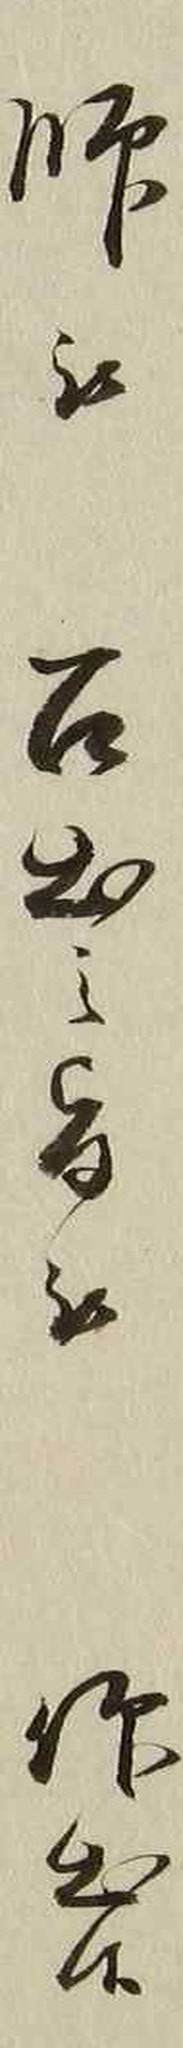師被召出之旨被仰出候
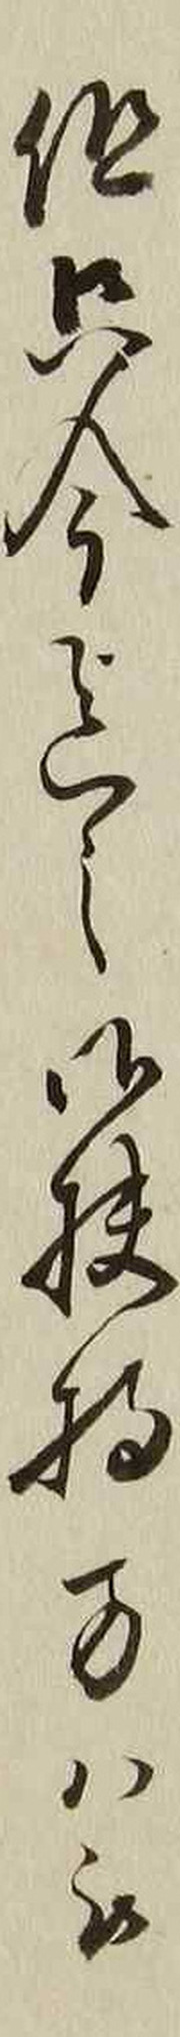但只今迄之御扶持方ハ被
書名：諸士系譜　巻之52　に之部3
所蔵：会津若松市立会津図書館
